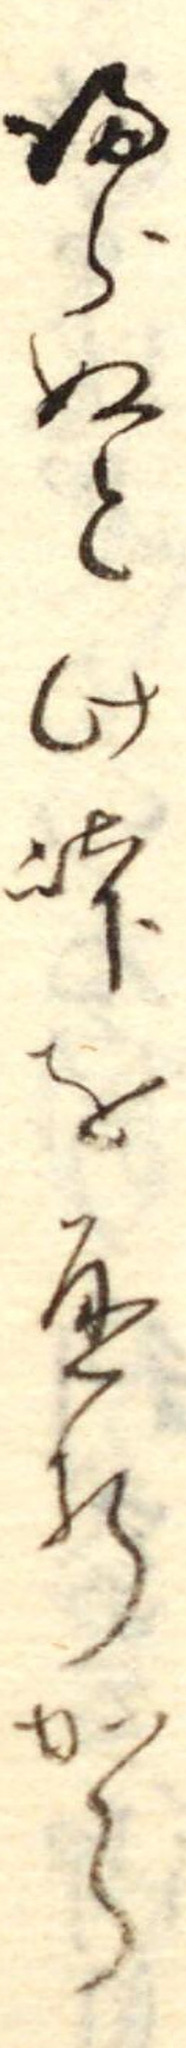帰らぬと此峠を通折から
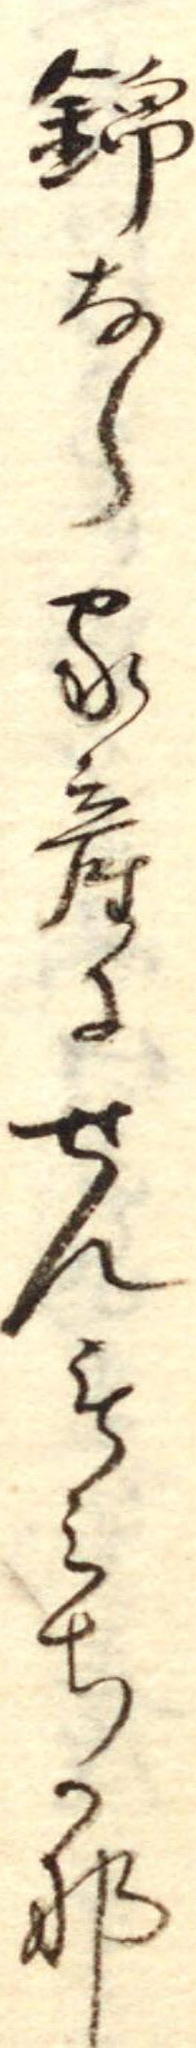錦なら家産にせんもみちかな
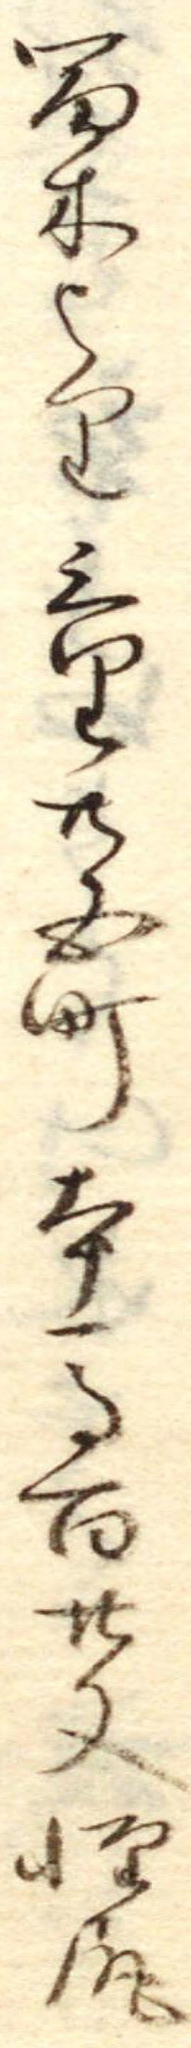冨木より三里廿五町本馬百廿文軽尻
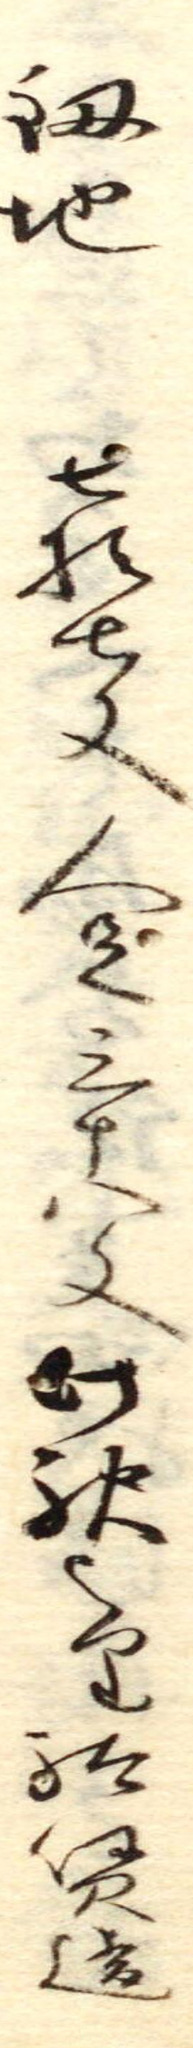釼地七拾七文人足三十八文此駅より駄賃違
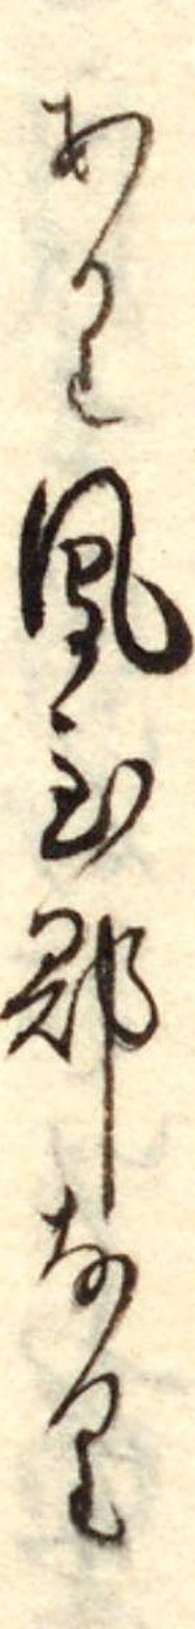あり鳳至郡なり
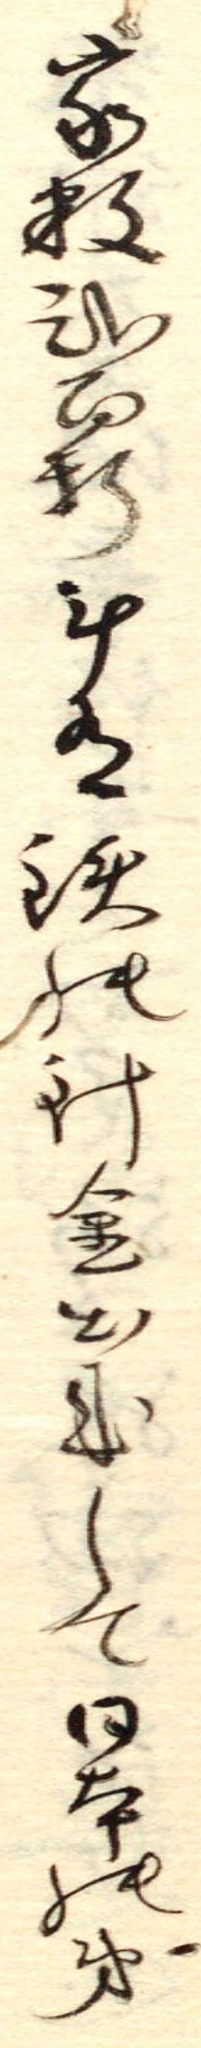家数弐百軒計有鉄の針金出来して日本の第
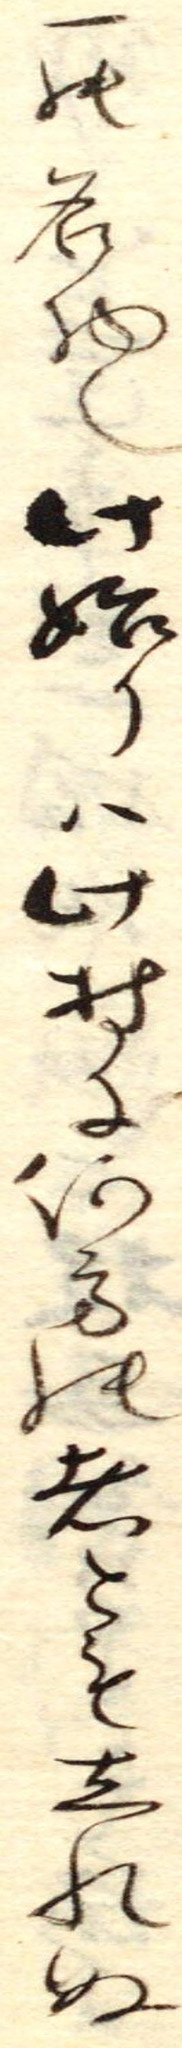一の名物也此始りは此村に何方の者ともしれぬ
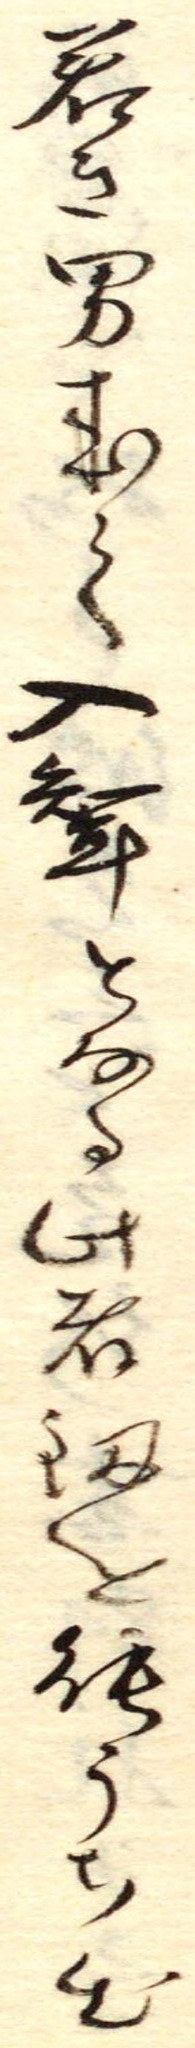若き男来て入聟となる此者釼を能うち出
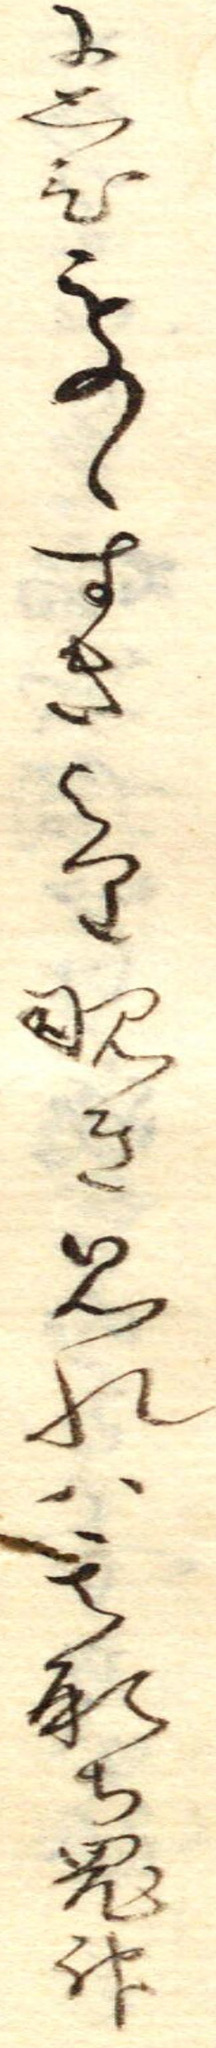に思ひものゝすきより覗き見れは其形り鬼神

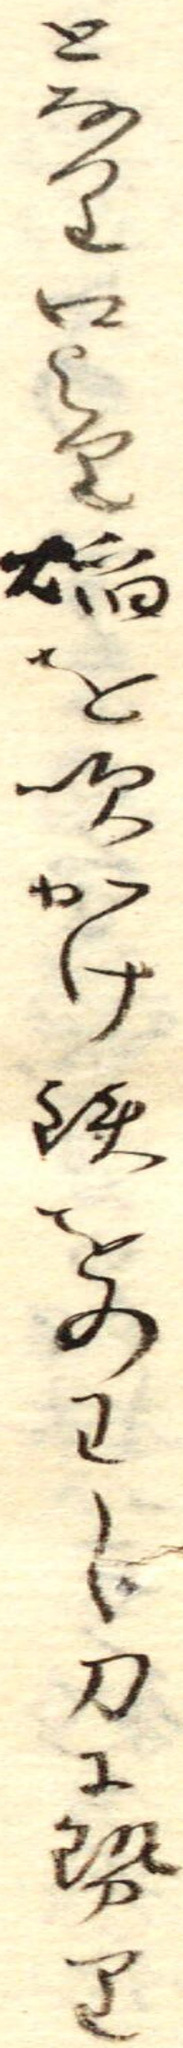となり口より焔を吹かけ鉄をのわし刀にせり
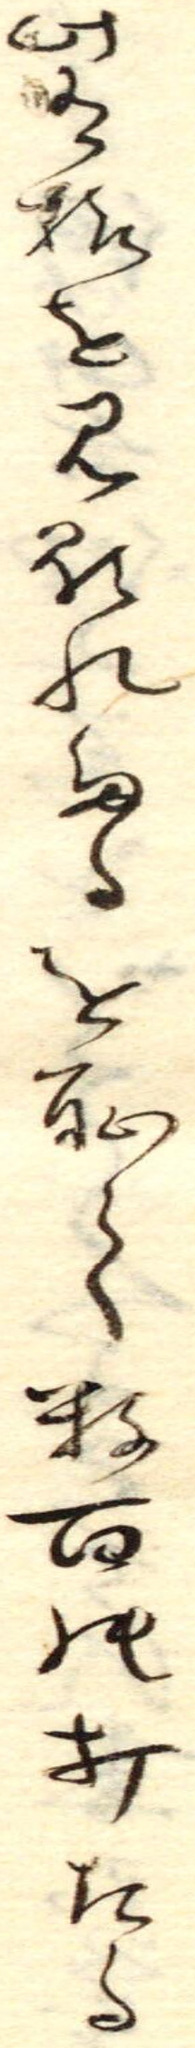此有様を見られらるを恥して数百の打たる
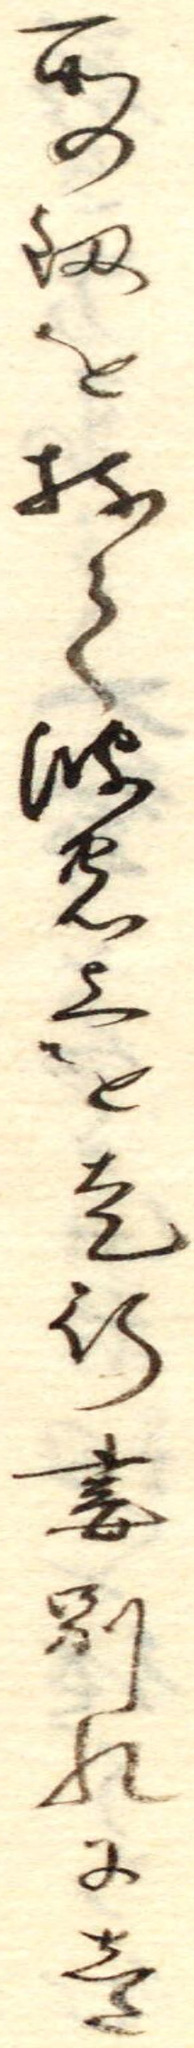所の釼を持て波の上を走行妻別れにした
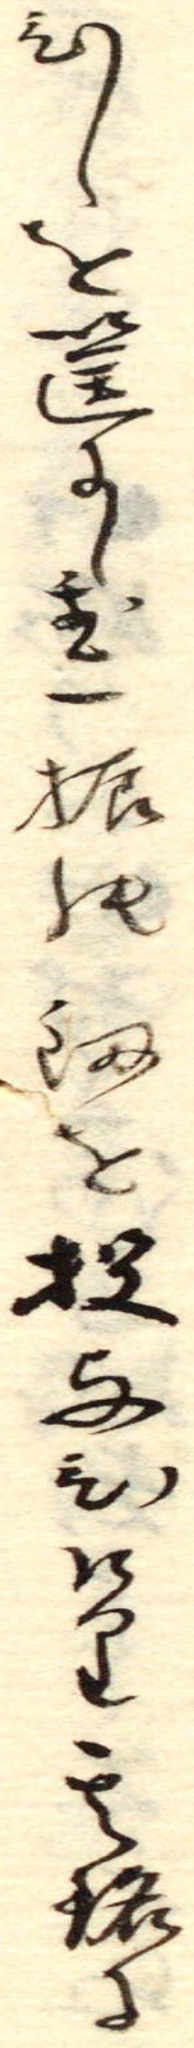ひしを筐にし置一振りの釼を投げ与ひけり其銘に
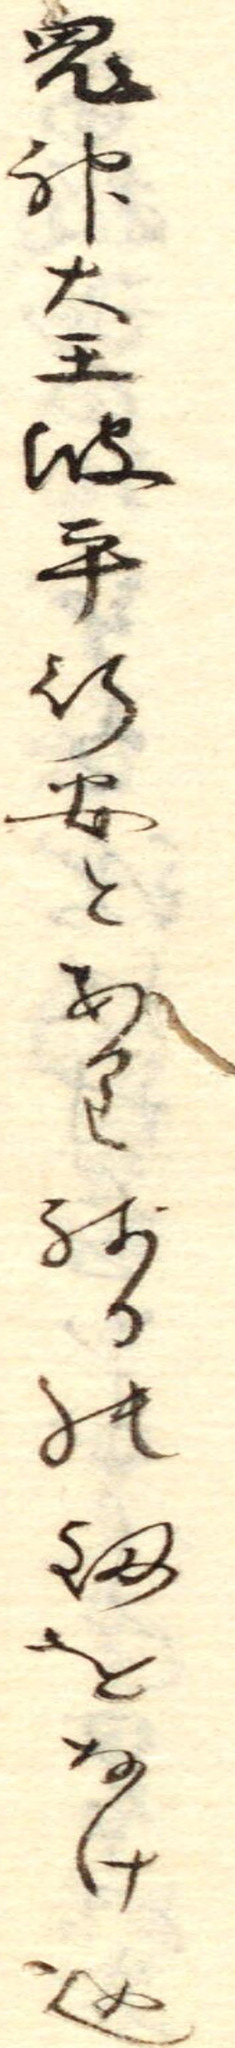鬼神大王波平行安とあり残りの釼をなけ込
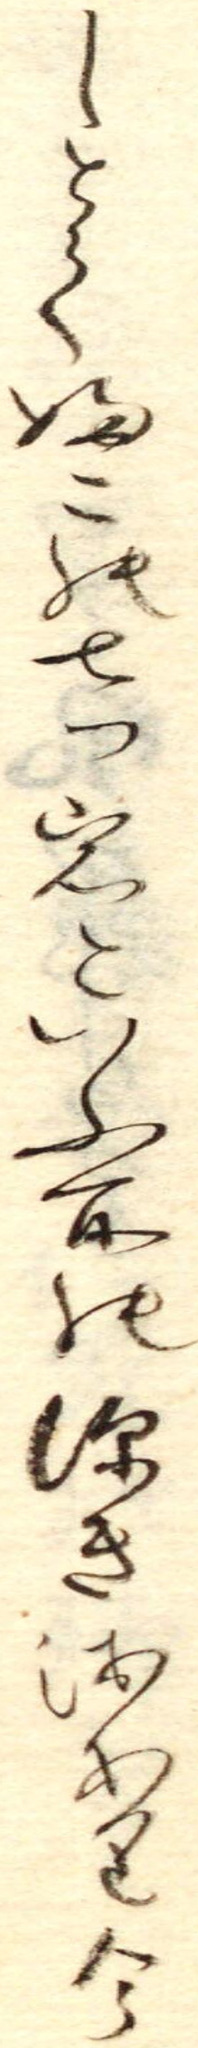しとてふこの七つ岩といふ所の深き海あり今
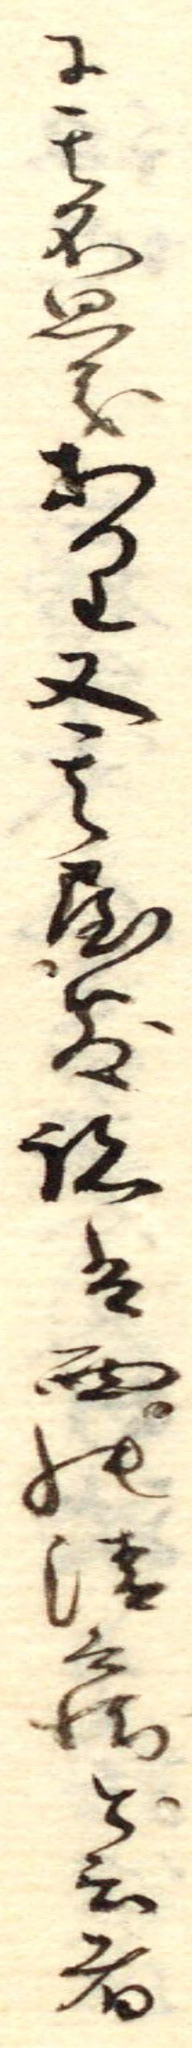に其不思義あり又其屋敷跡は西の清兵衛と云者
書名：能登名跡誌
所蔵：Ishikawa Prefectural Library
